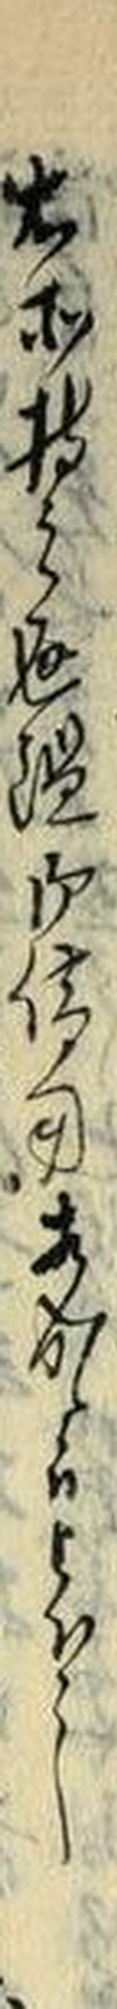右所持之通鑑御借用相成候ニ付被下之
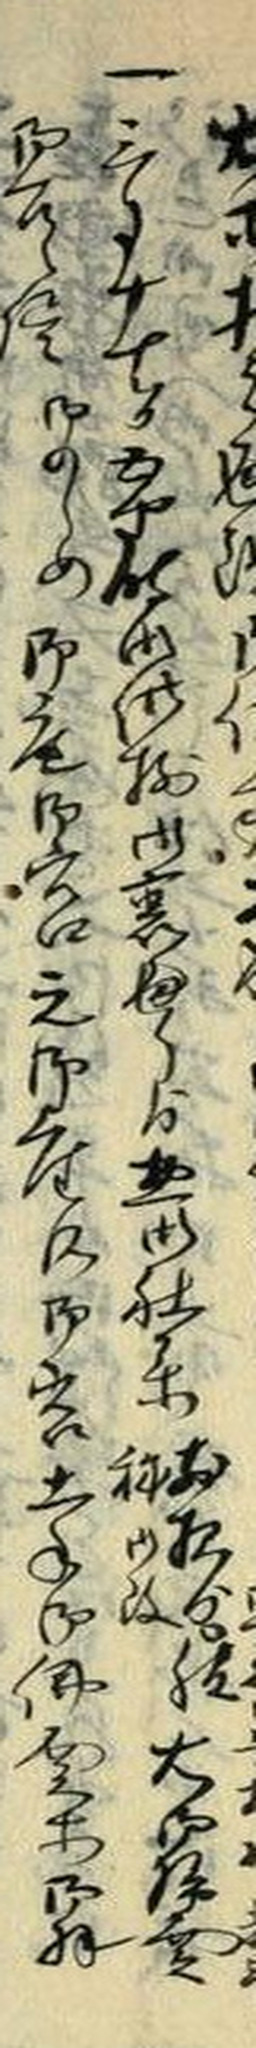御召之儘御のしめ御庭御宮元御座所御宮土手御仏殿等御拝
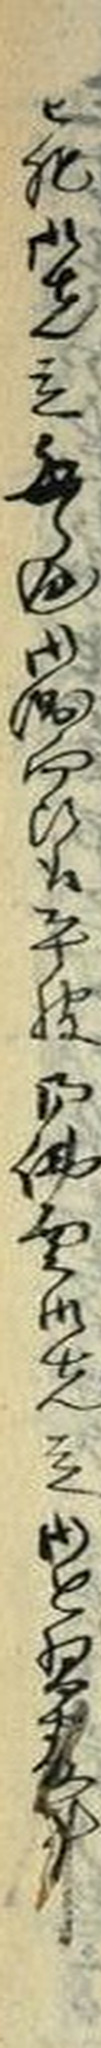被遊御先立毎之通御側向頭取平服御仏殿御先立御近習番斗
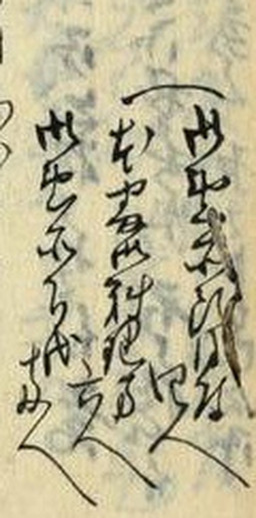本番御料理方六人
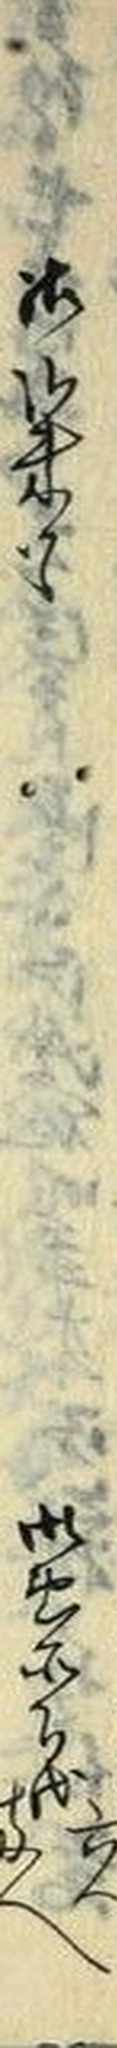銀弐朱ツヽ御台所下代両人
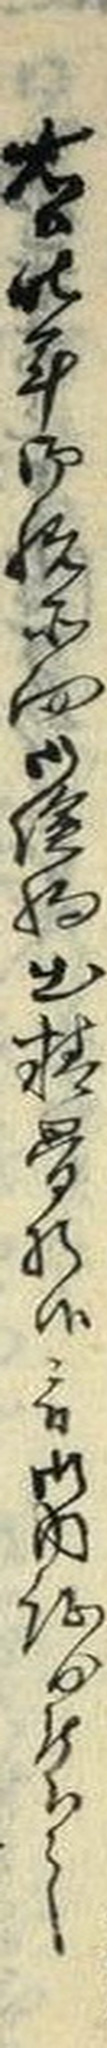右ハ昨年御膳所向御倹約出精骨折候ニ付御内証ゟ被下之
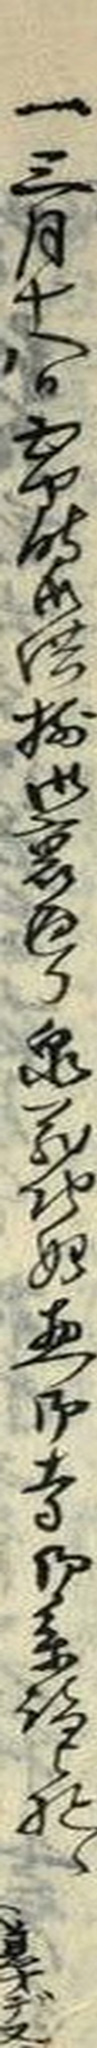一三月十八日五半時御供揃御裏通り泉蔵院始惣御寺御参詣被遊候
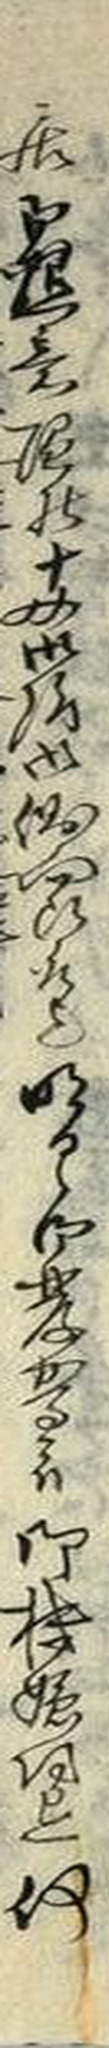居御懇意隠居両御附御側向頭取迄明日之御発駕ニ付御機嫌伺申上何
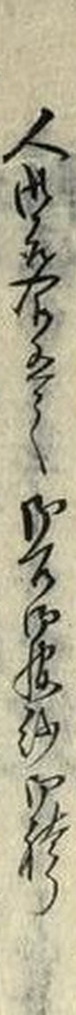人御取合有之御召御服紗御袴
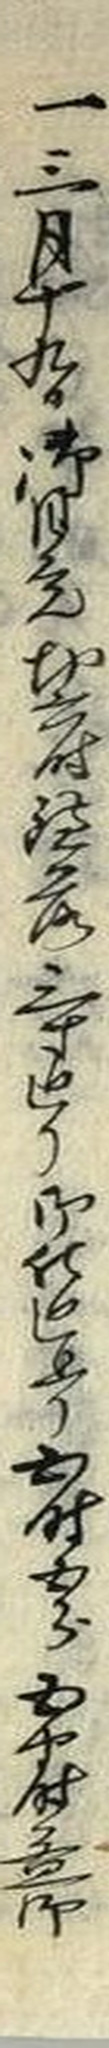一三月十九日御目覚切六時鎌落三寸廻り御仕廻上り五時五分五半時益御
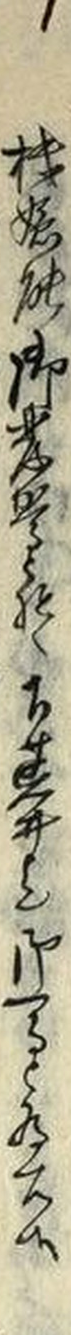機嫌能御発駕被遊候下荒井迄御馬被為召候
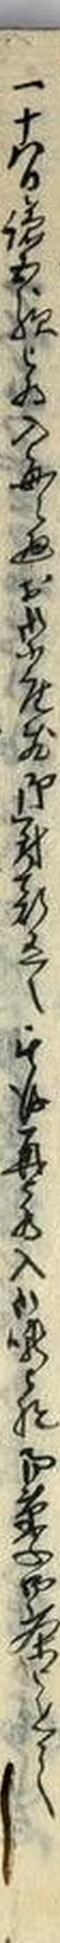一十八日謙五郎様被為入毎之通於御小座敷御対顔有之其後再被為入御噺被遊御菓子御茶被進之
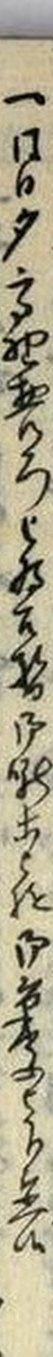一同日夕高野惣左衛門被為召暫御噺等被遊御菓子被下置候

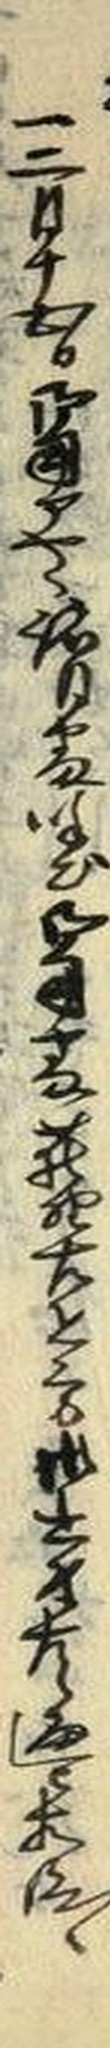一二月十五日御用部やへ諸月番呼出御用番荻野左近方御書付左之通被相渡候
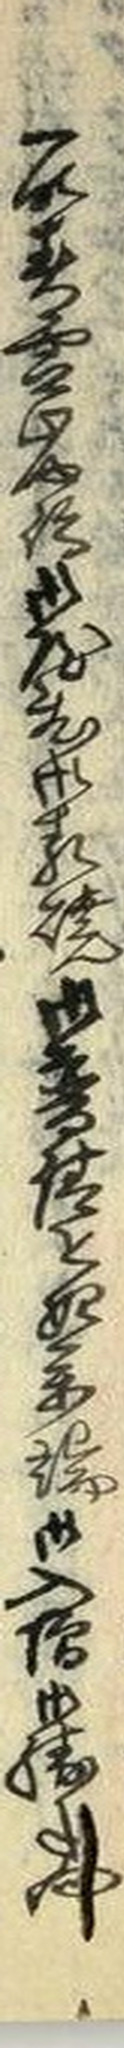一昨春霊岸嶋御屋敷御類焼御普請を始万端御入増御勝手向
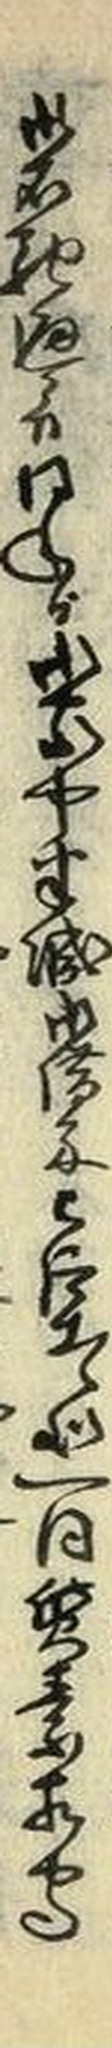御不馳通ニ付同年ゟ御家中半減御借米被仰出候処一同質素相守
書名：少傅日録抄（斉承付側向頭取日記、在国）
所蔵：福井県文書館 Fukui Prefectural Archives
